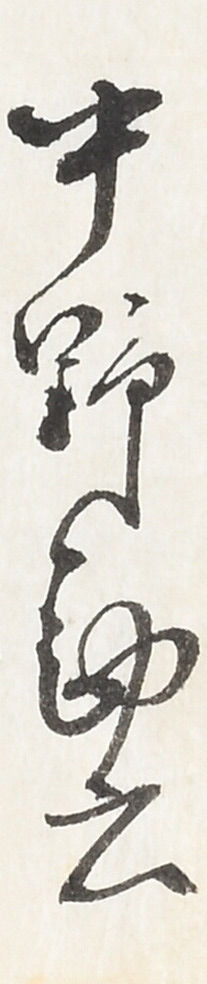中野勘六
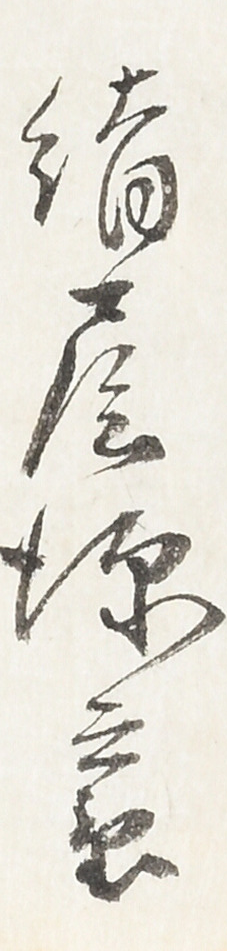絹屋源兵衛
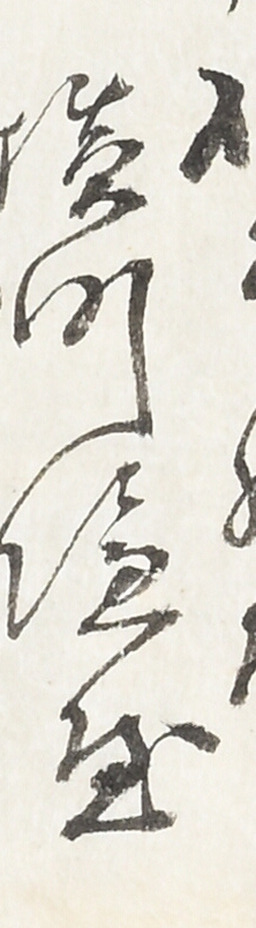横町塩屋
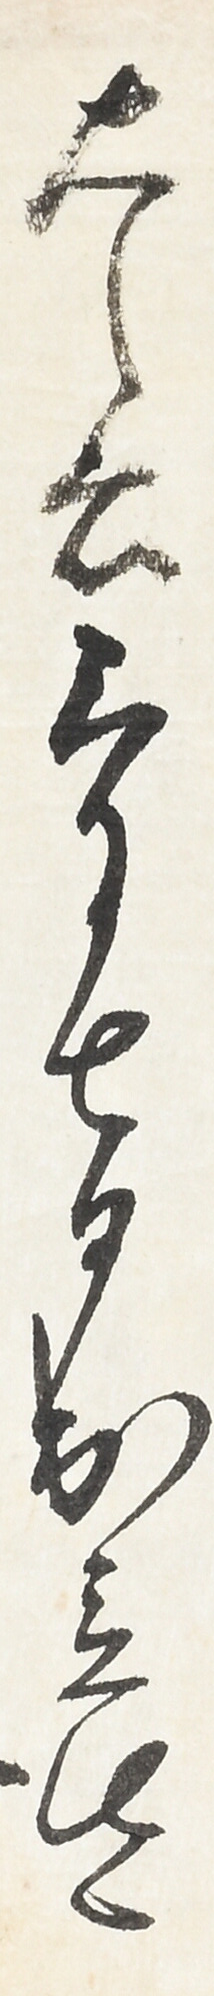右之者三月七日出立仕候
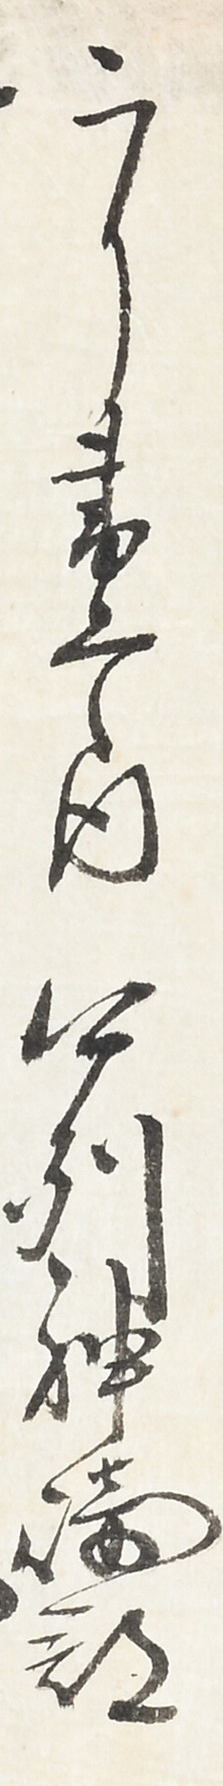二月書上之内江州神崎郡
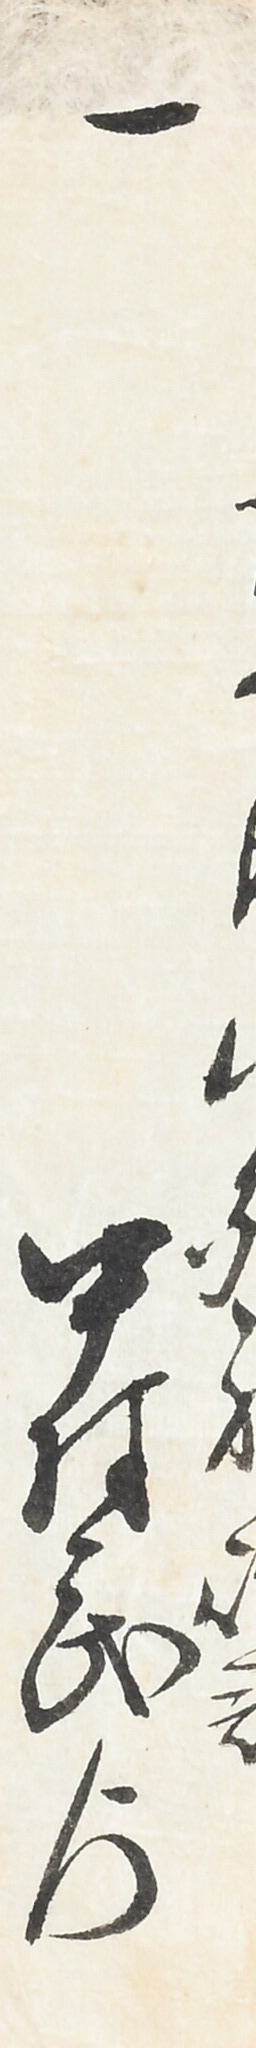一中村武衛門
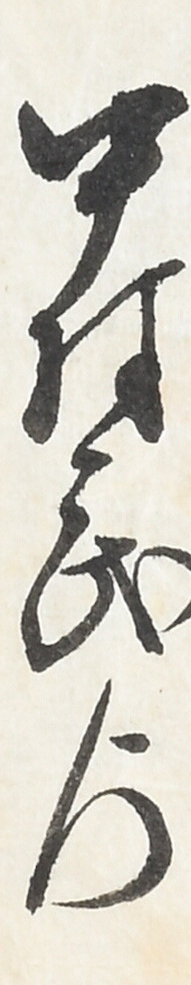一中村武衛門
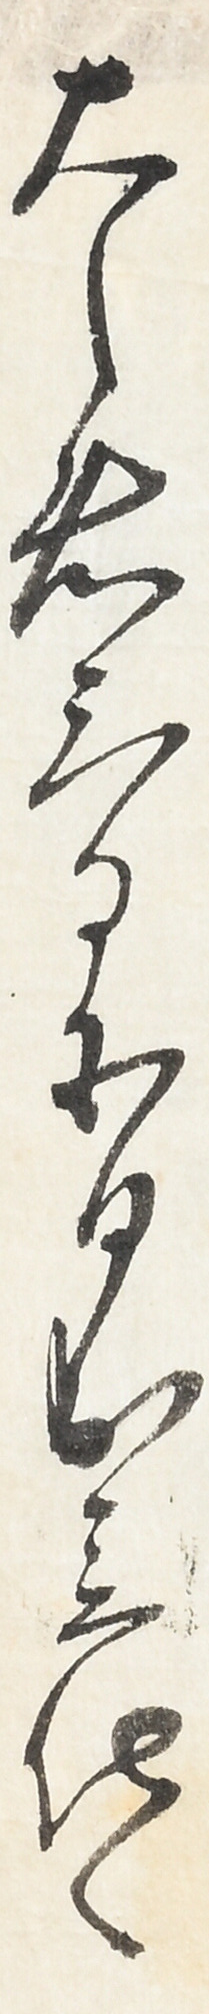右之者三月五日出立仕候

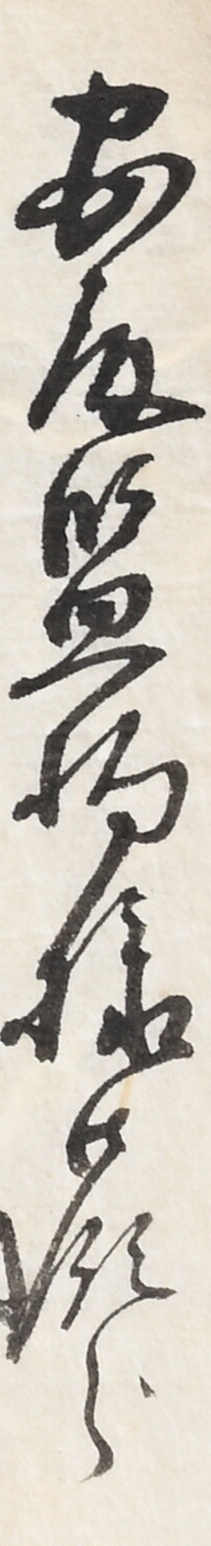安藤監物様御領分
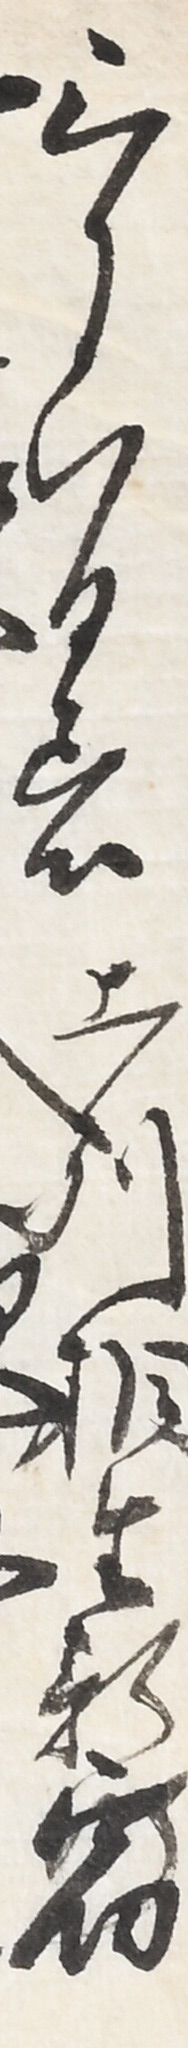三月八日着上州相生郡宿
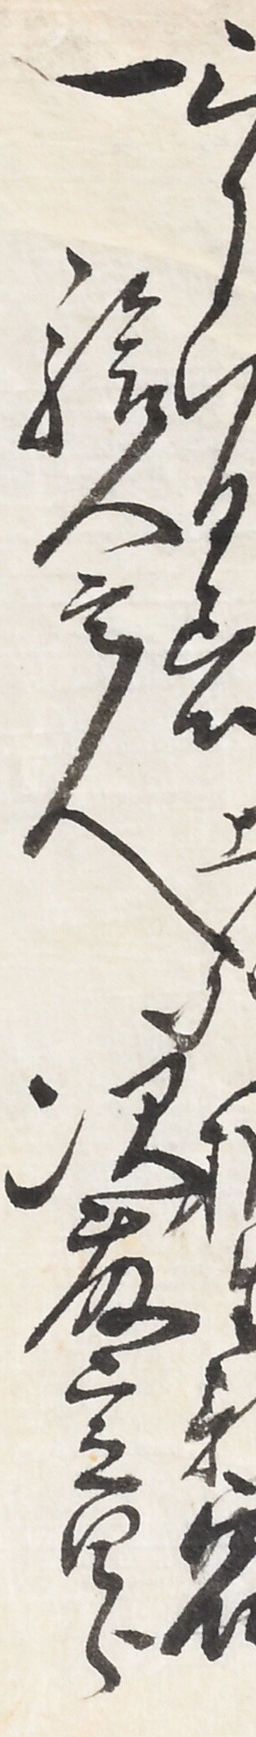一旅人壱人沢藤定四郎
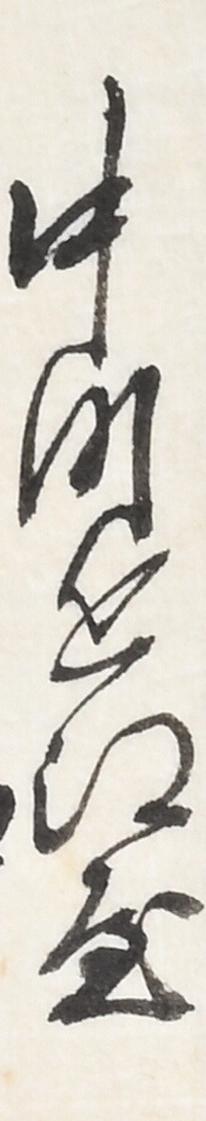中町近江屋
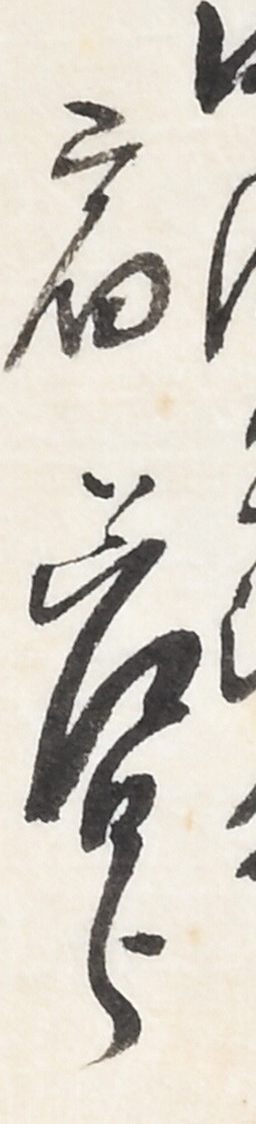宿吉左衛門
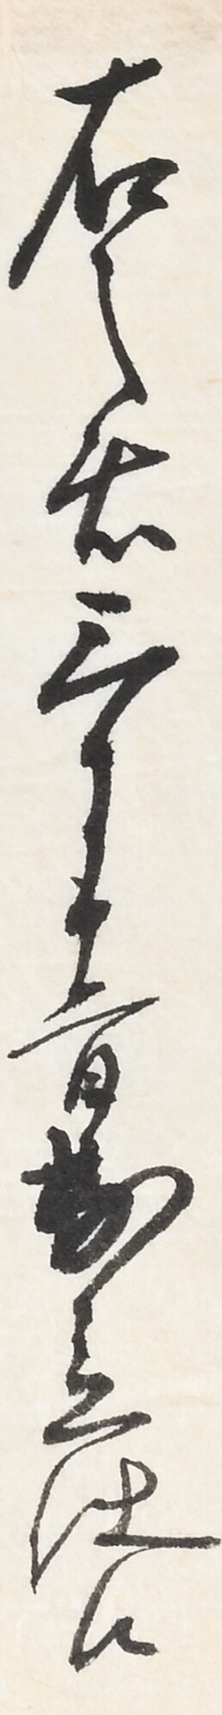右之者三月十二日出立仕候
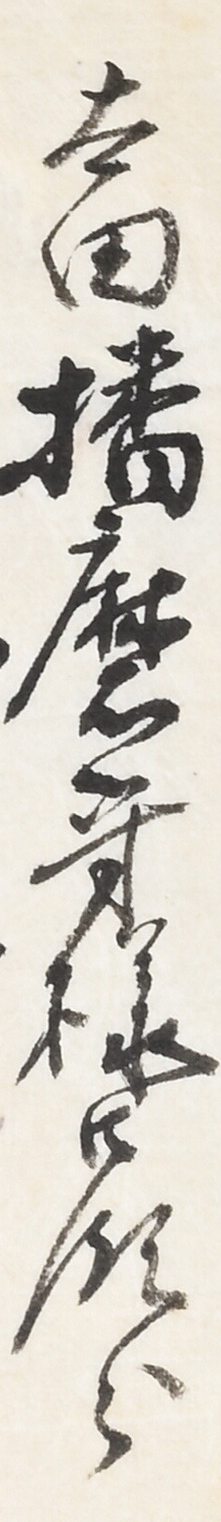太田播磨守様御領分
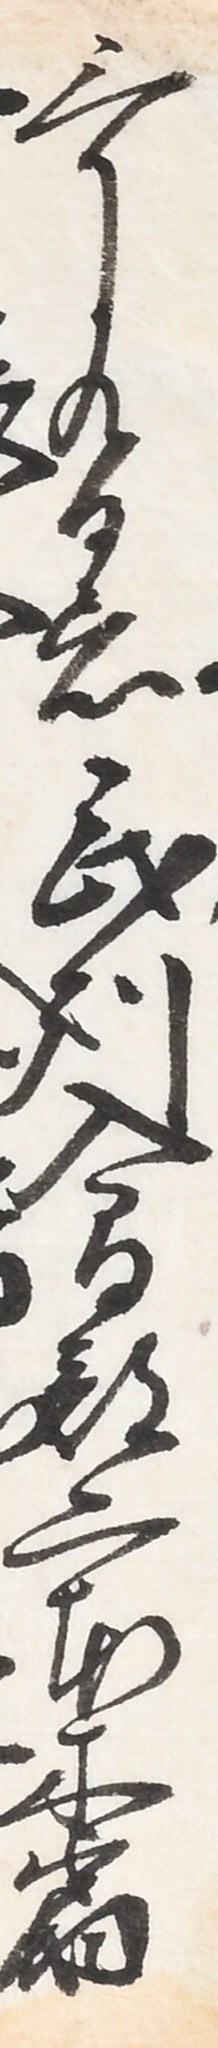三月九日着武州入間郡二本木宿
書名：旅人泊控帳
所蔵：伊那市立高遠町図書館・合同会社AMANE
